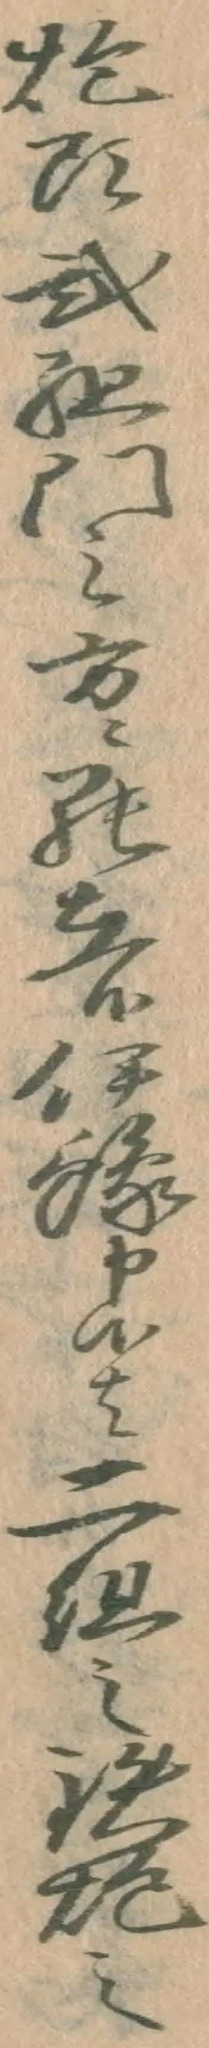炮頭弐組門之方に罷在候伊予申候は二組之鉄炮之
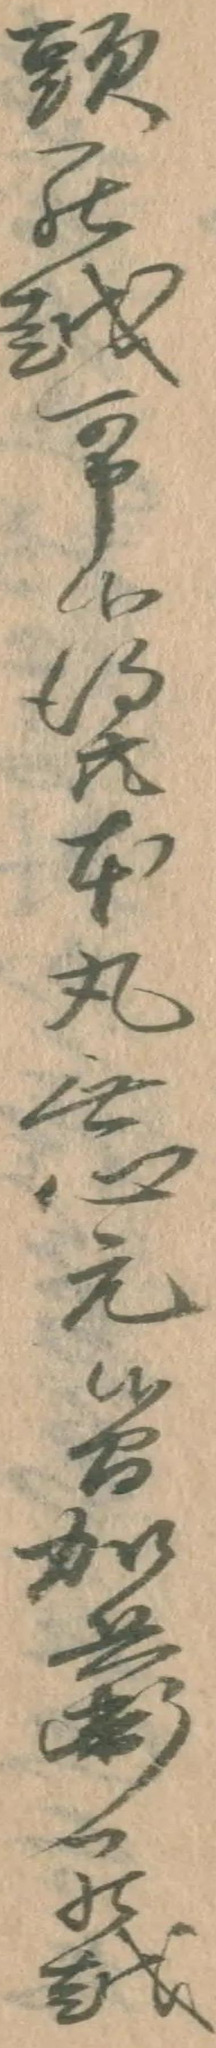頭罷越可申候得共本丸無心元候間加兵衛罷越
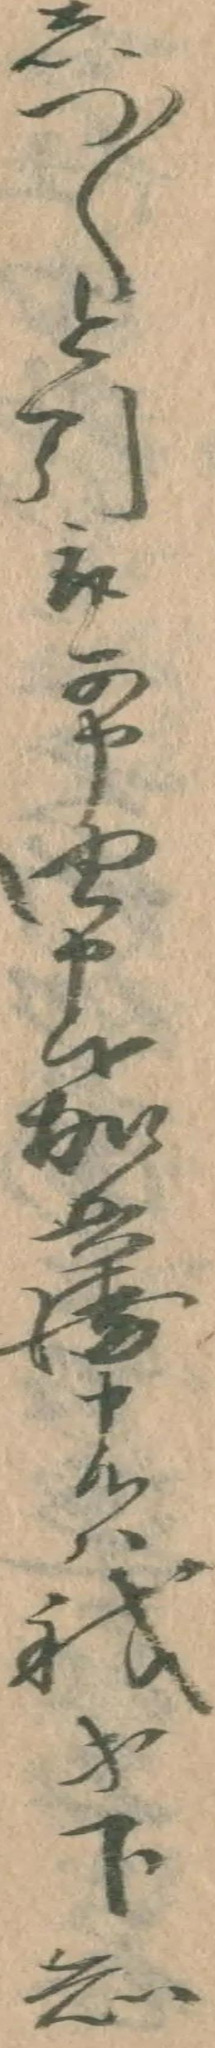しつ〳〵と引取可申由申候加兵衛申候は我等下知
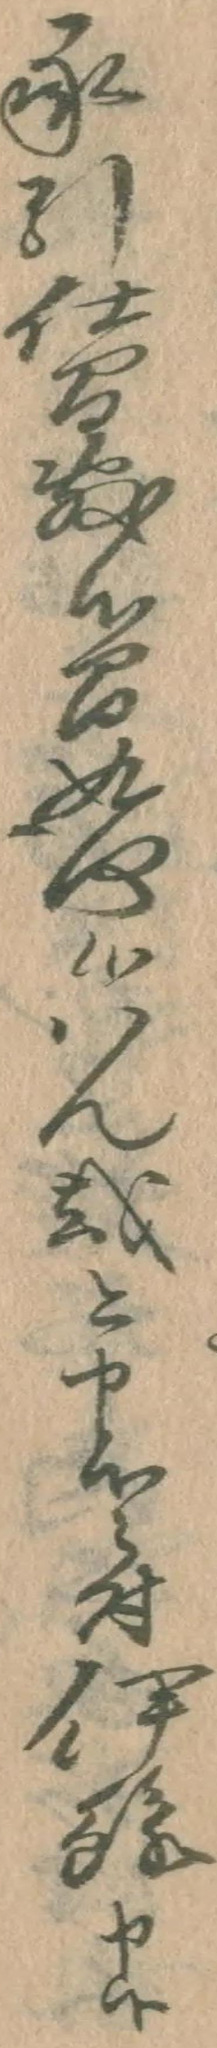承引仕間敷候間如何候はん哉と申候に付伊予申候
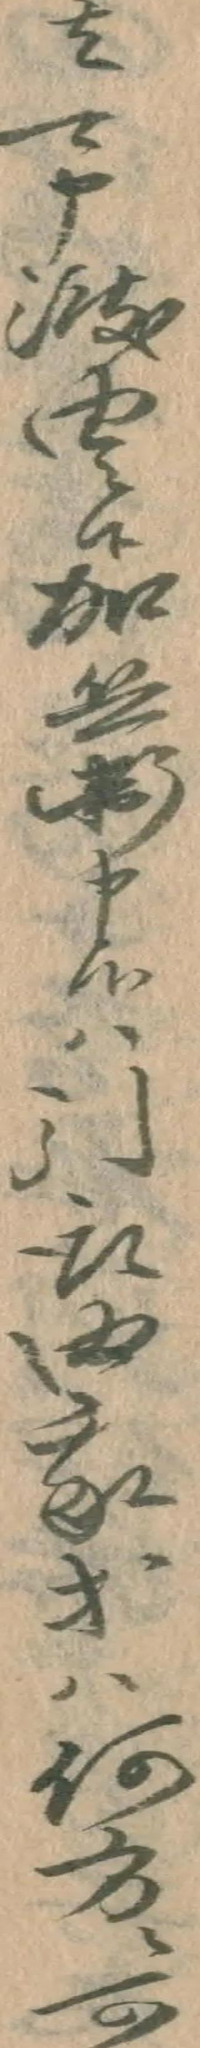は可申渡由に候加兵衛申候は引取由我等は何方に可
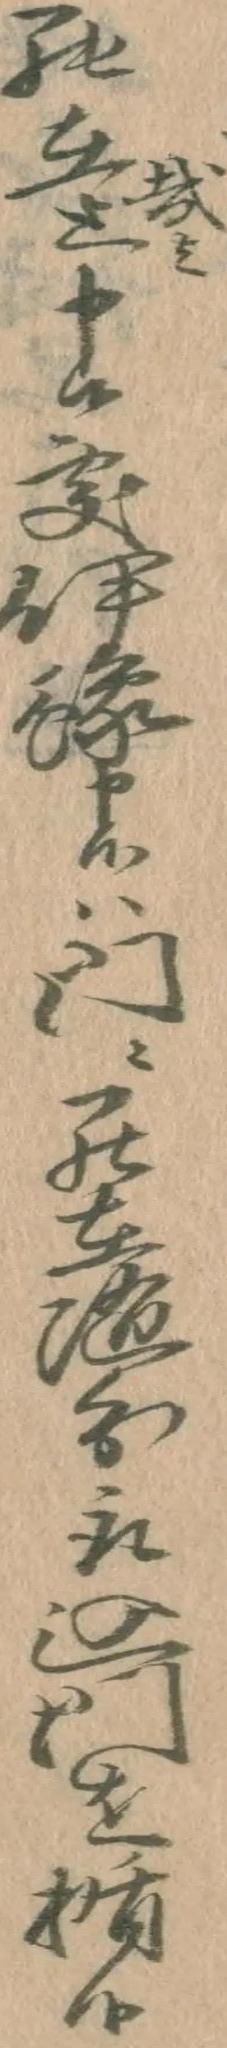罷在と哉と申候処伊予申候は内に罷在随分取込門を楯候
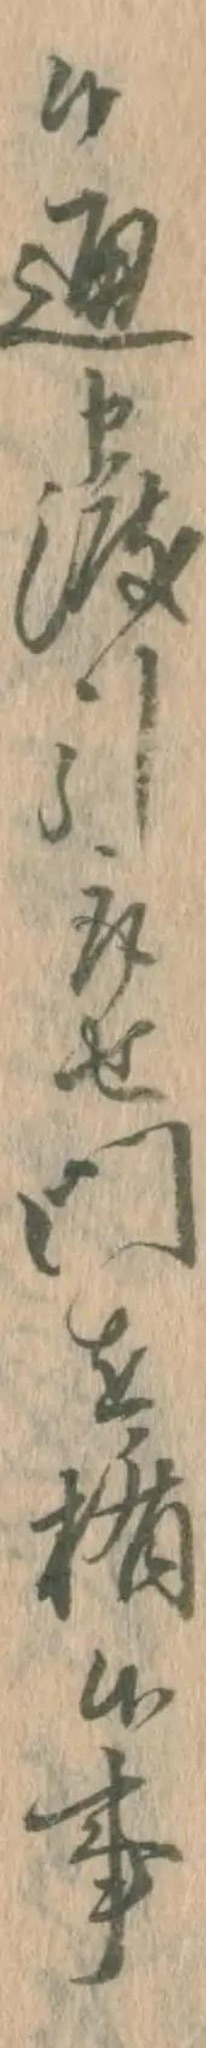候通申渡引取せ門を楯候事
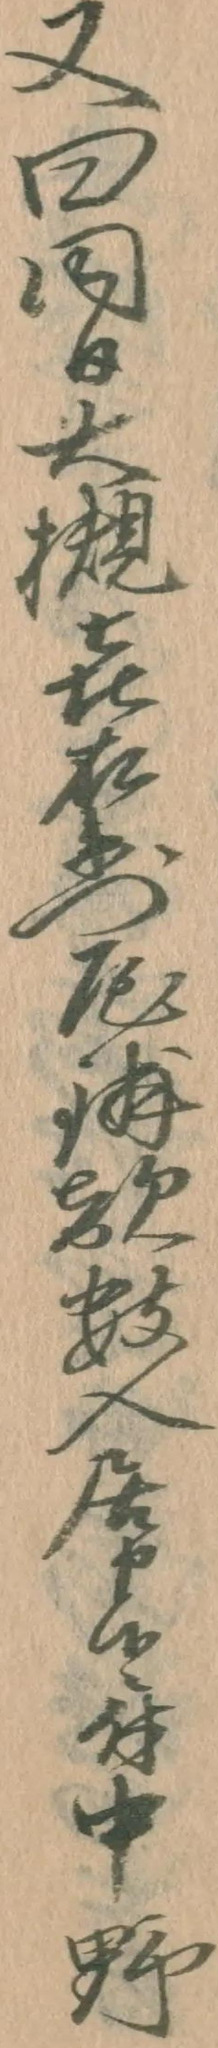又曰同日大槻喜右衛門屋鋪敵数人居申候に付中野
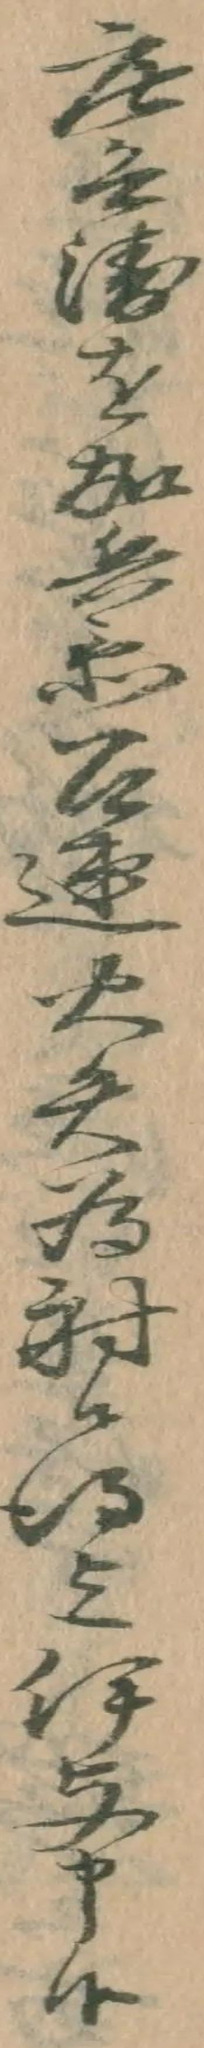庄兵衛を加兵衛召連火矢為射候得と伊予申候
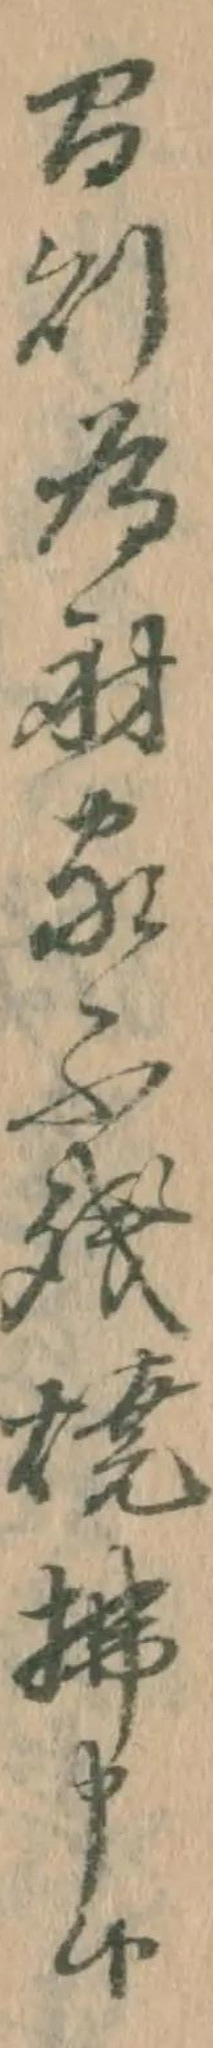間則為射家不残焼払申候
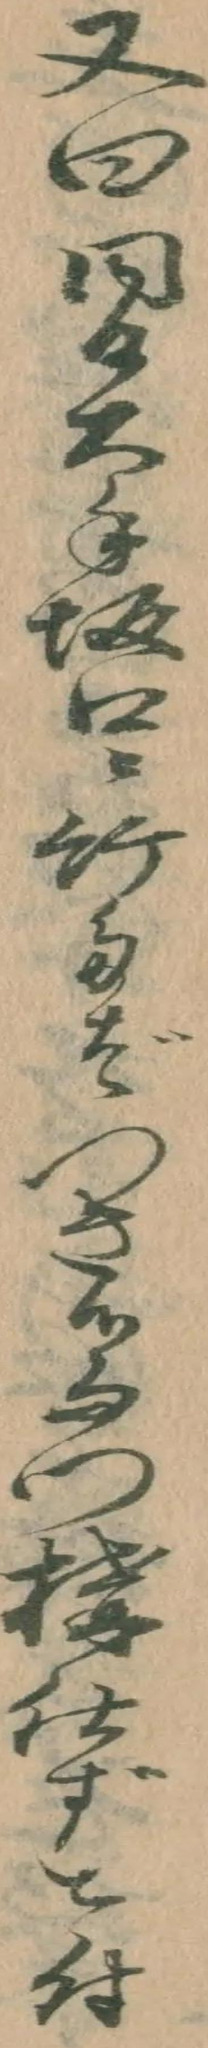又曰同日大手坂口に竹たばつき候而門構仕ずと付
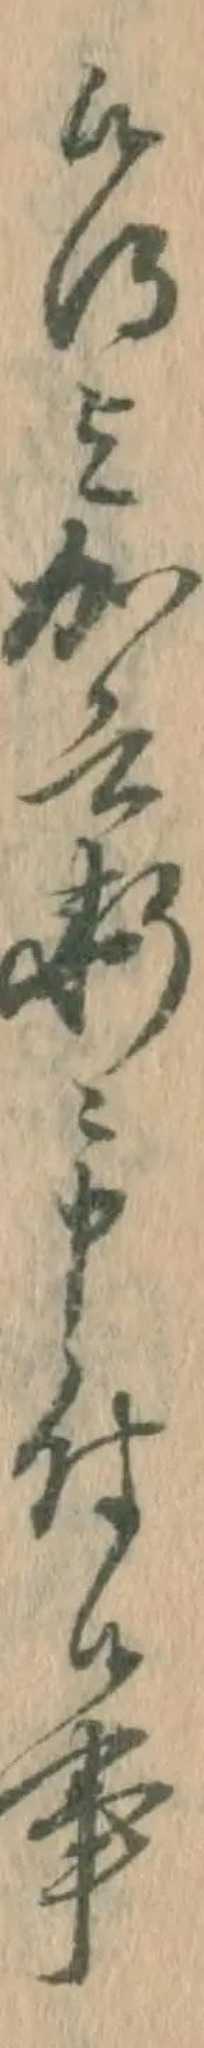候得と加兵衛に申付候事
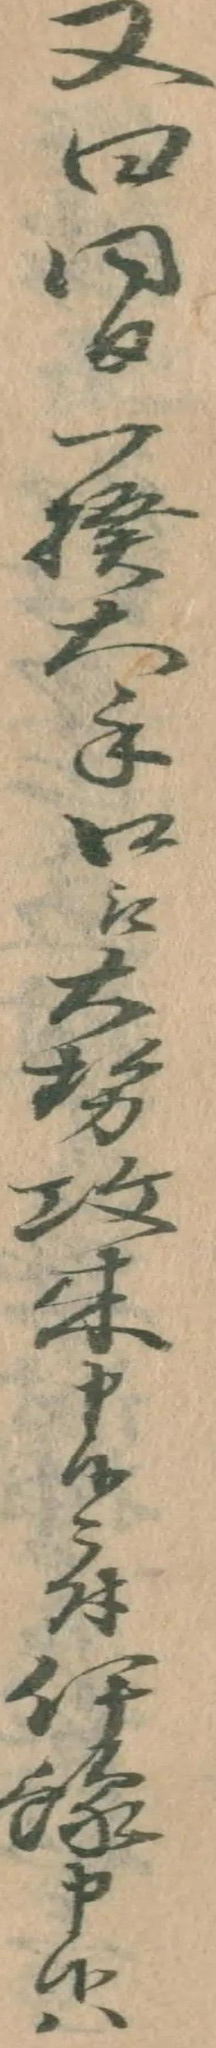又曰同日一揆大手口江大勢攻来申候に付伊予申候は
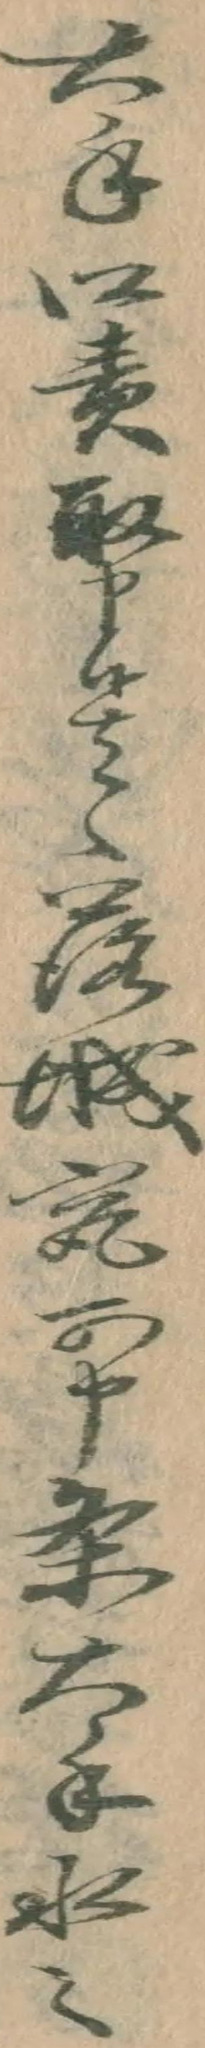大手口責取申候はゝ落城究可申条大手水之
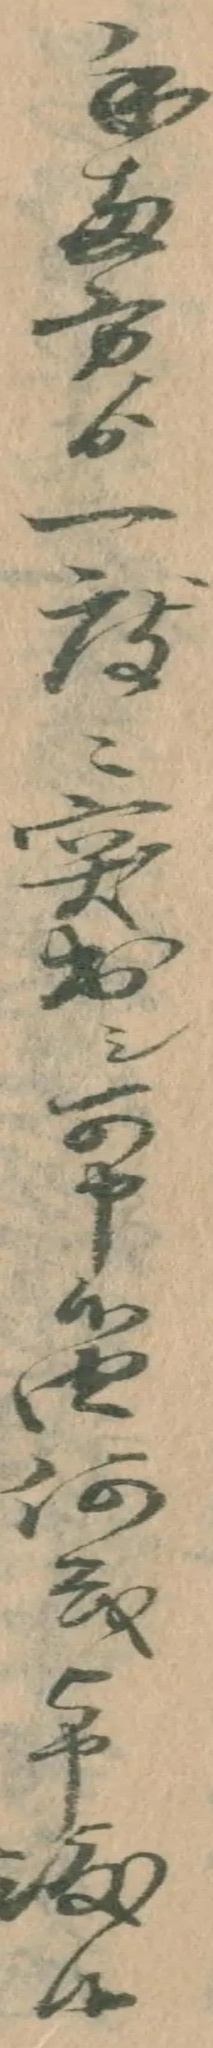手両方ゟ一度に突出シ可申候由何も被申渡候
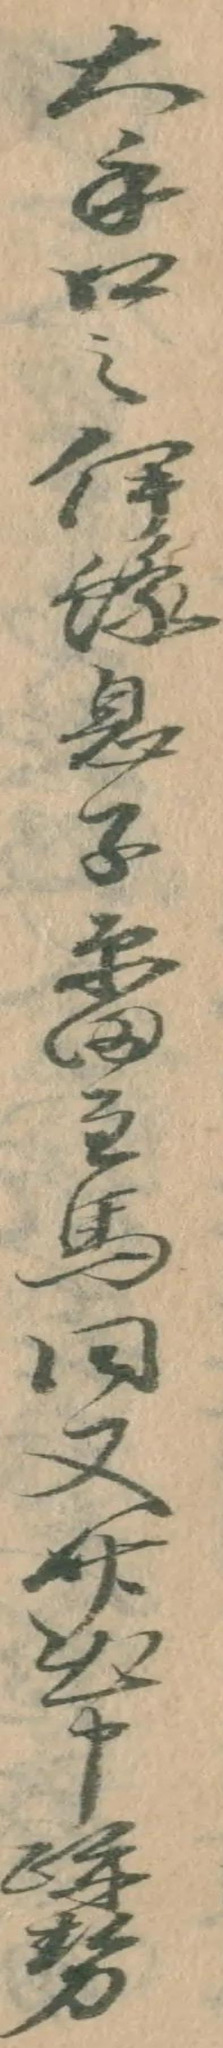大手口之伊予息子原田主馬同又介出申跡勢
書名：切支丹御退治記 49巻. [3]
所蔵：国立国会図書館 National Diet Library, JAPAN
